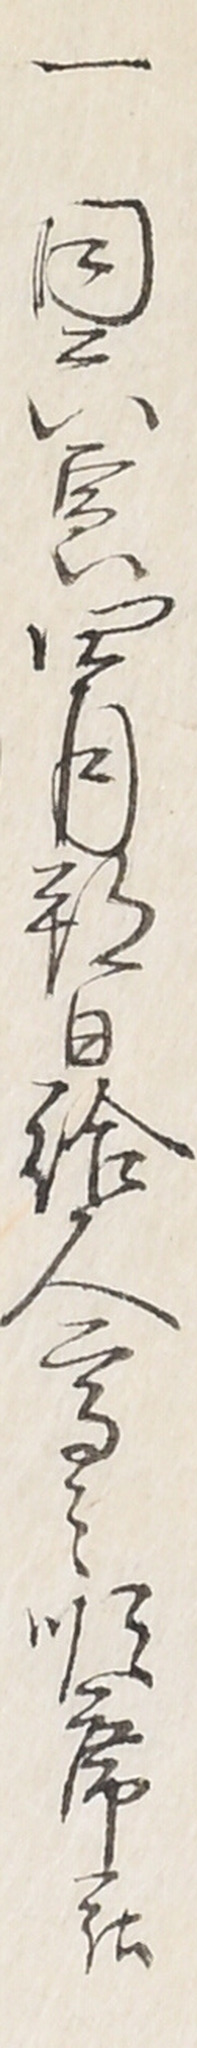一同六寅四月朔日給人高之順席被
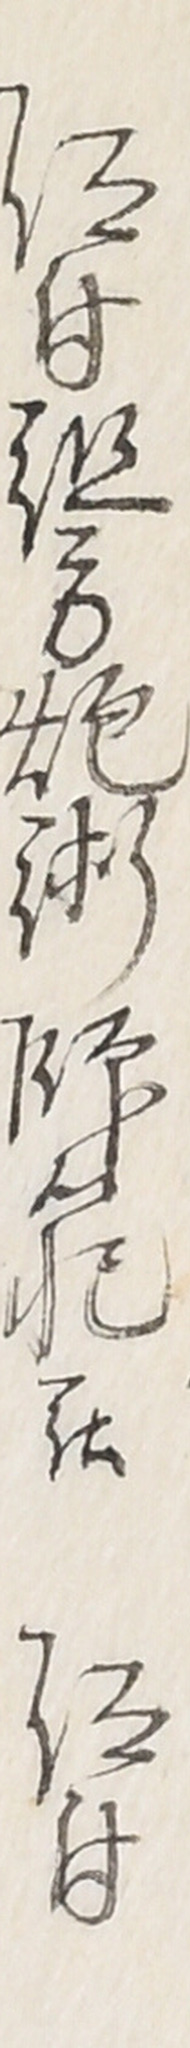仰付組方炮術師範被仰付
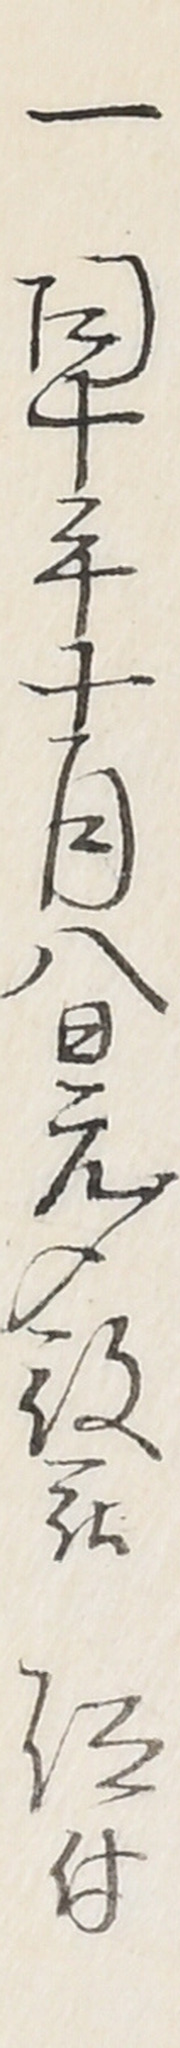一同十午十月八日元〆役被仰付
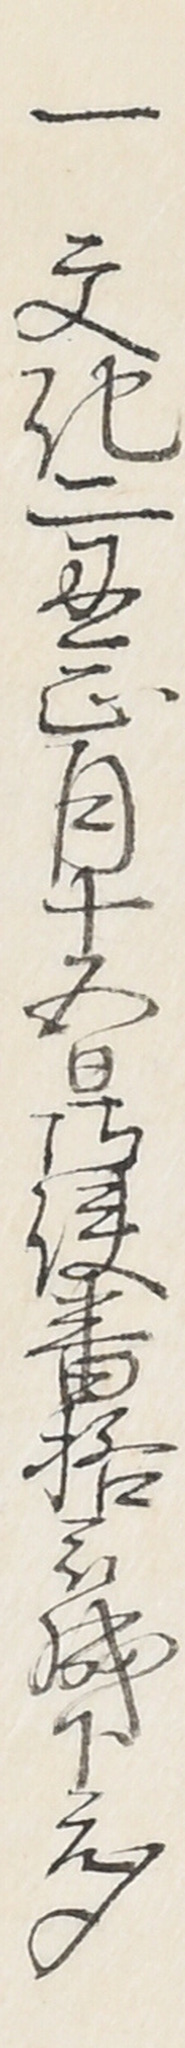一文化二丑正月十五日御使番格被成下元〆
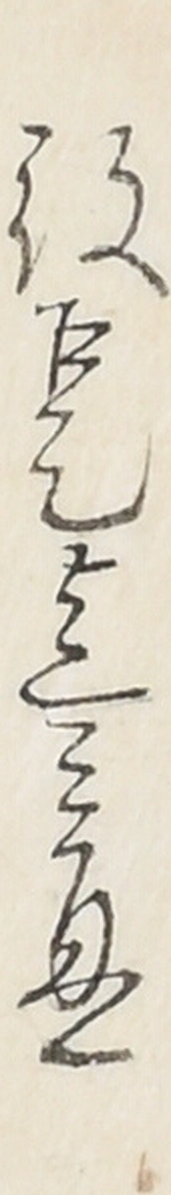役是迄之通
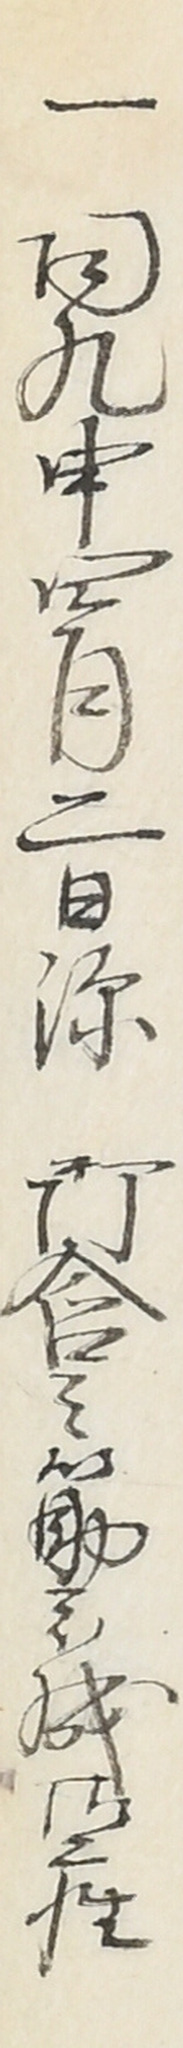一同九申四月二日深御含之筋被成御座
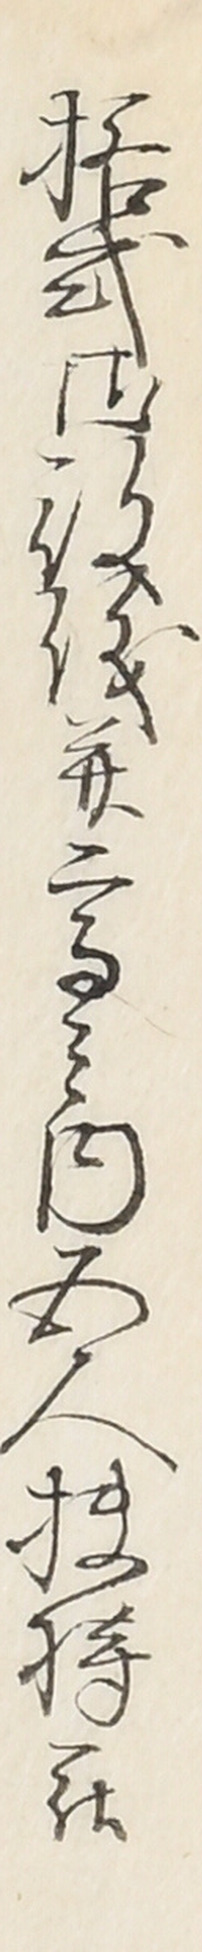格式御役儀并高之内五人扶持被
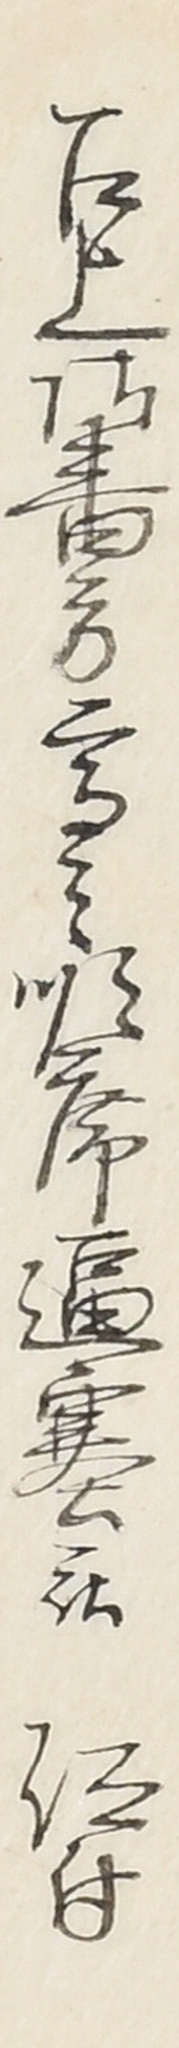召上御番方高之順席逼塞被仰付
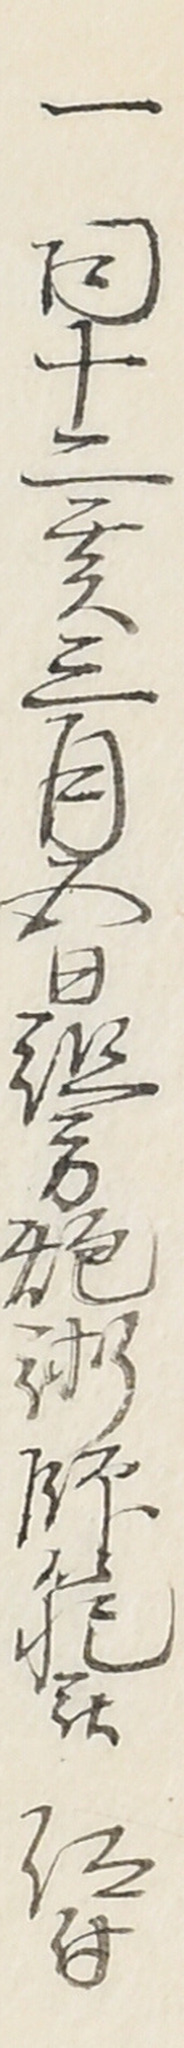一同十二亥三月五日組方炮術師範被仰付
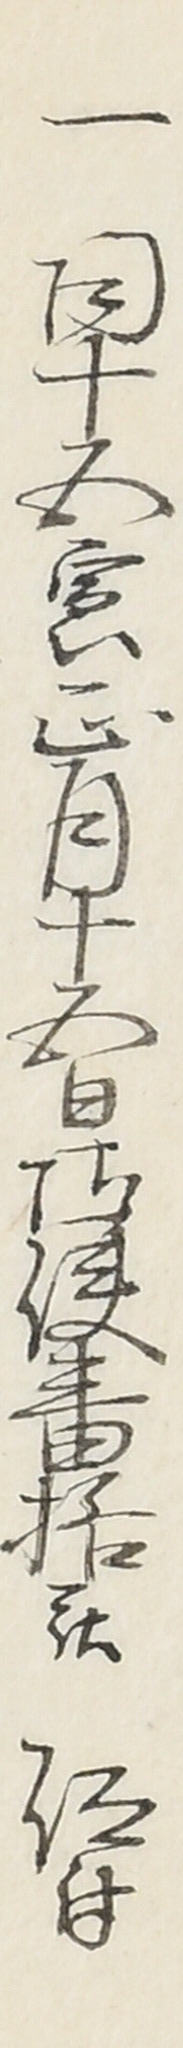一同十五寅正月十五日御使番格被仰付
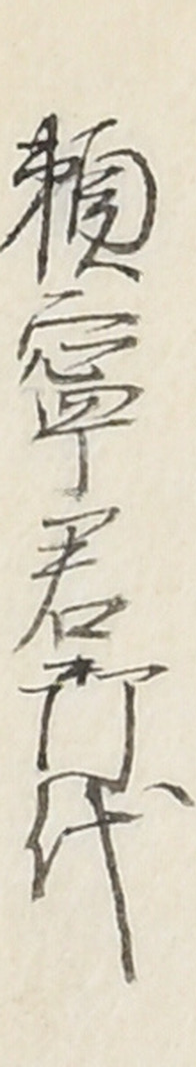頼寧君御代
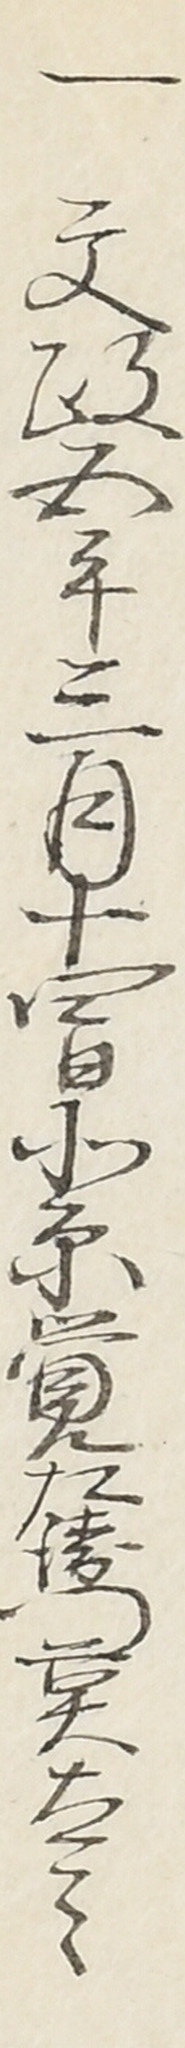一文政五午三月十四日北原覚左衛門莫太之
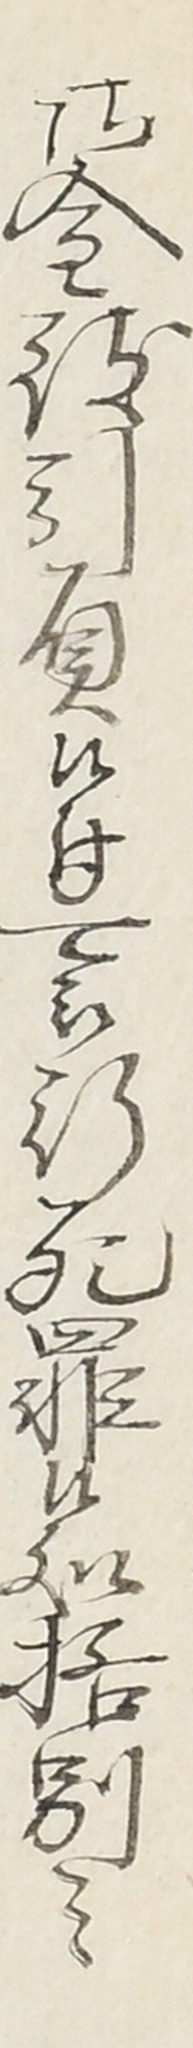御金致引負候付可被行死罪候処格別之
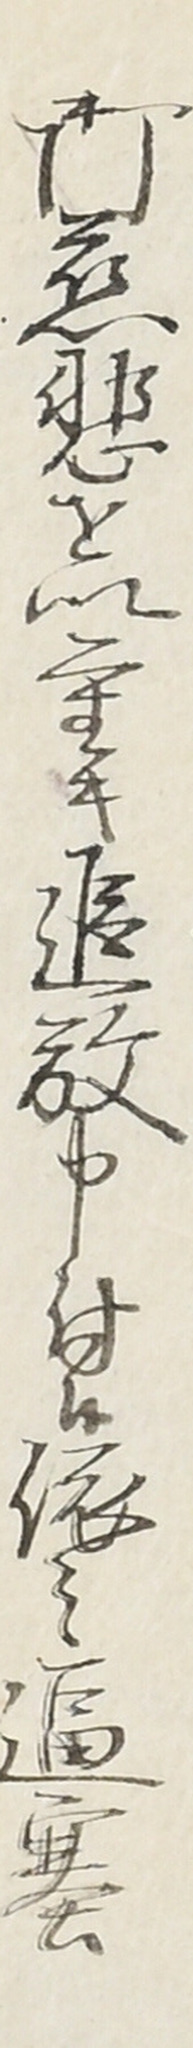御慈悲を以重キ追放申付候依之逼塞
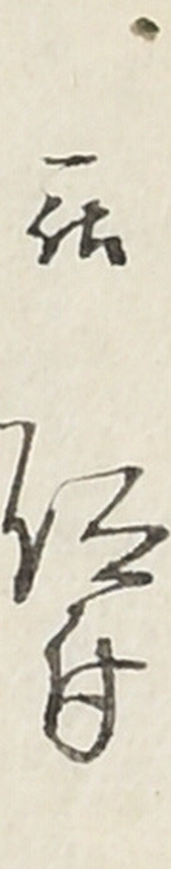被仰付
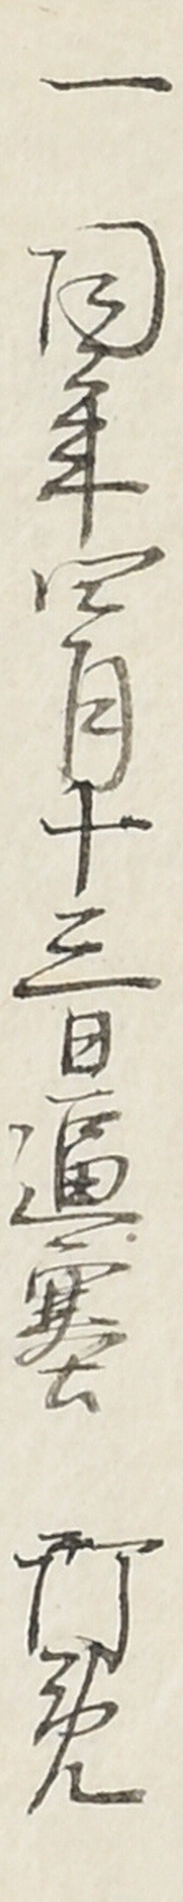一同年四月十三日逼塞御免
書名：給人諸士勤仕録（七）
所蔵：伊那市立高遠町図書館・合同会社AMANE
